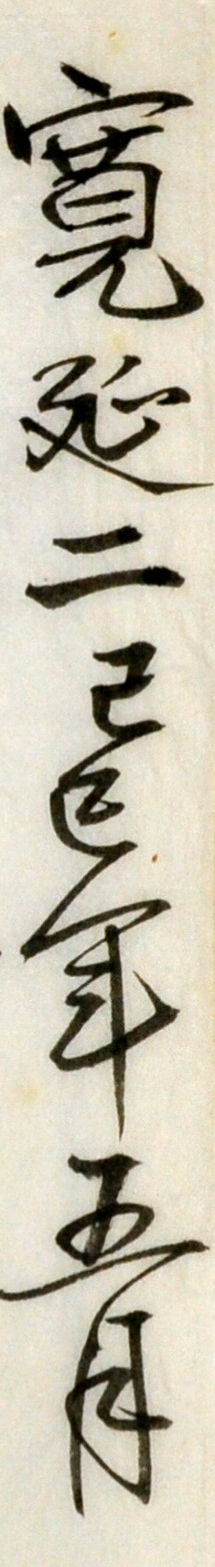寛延二己巳年五月
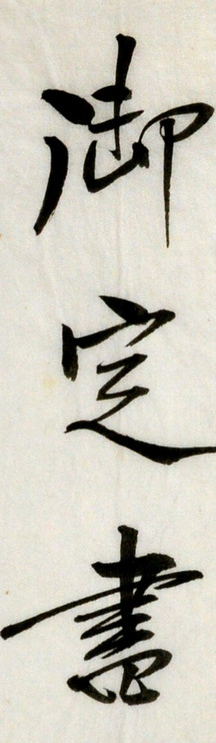御定書

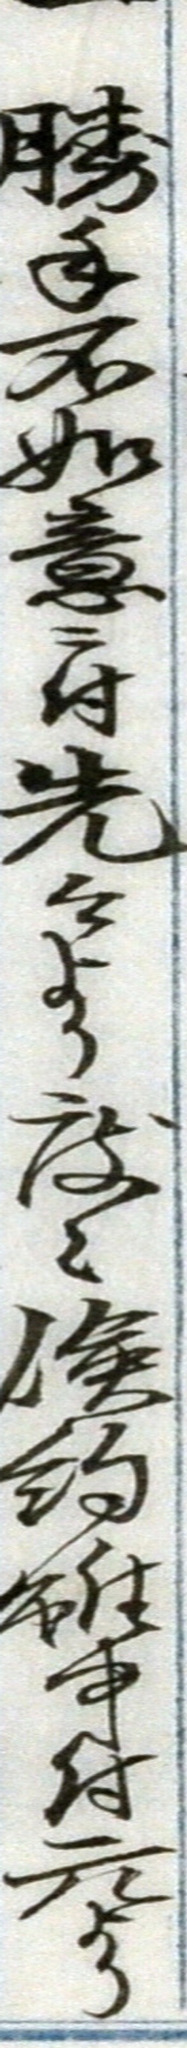一勝手不如意ニ付先々より度々倹約雖申付元より
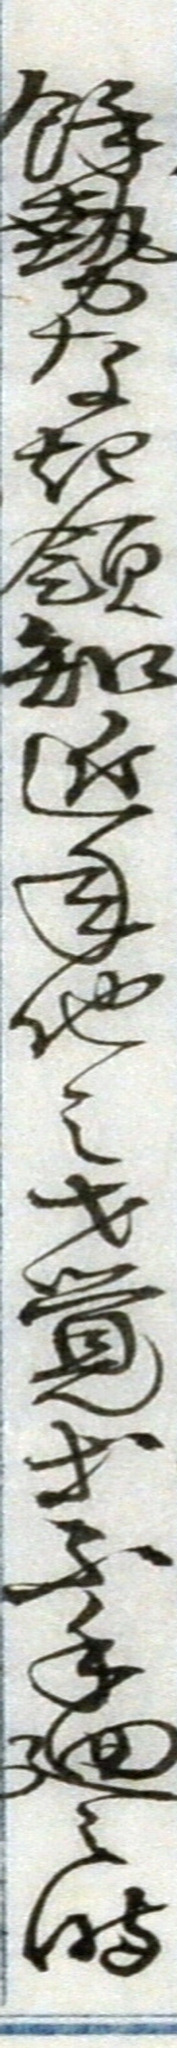余勢なき領知近年他之才覚等不手廻之時
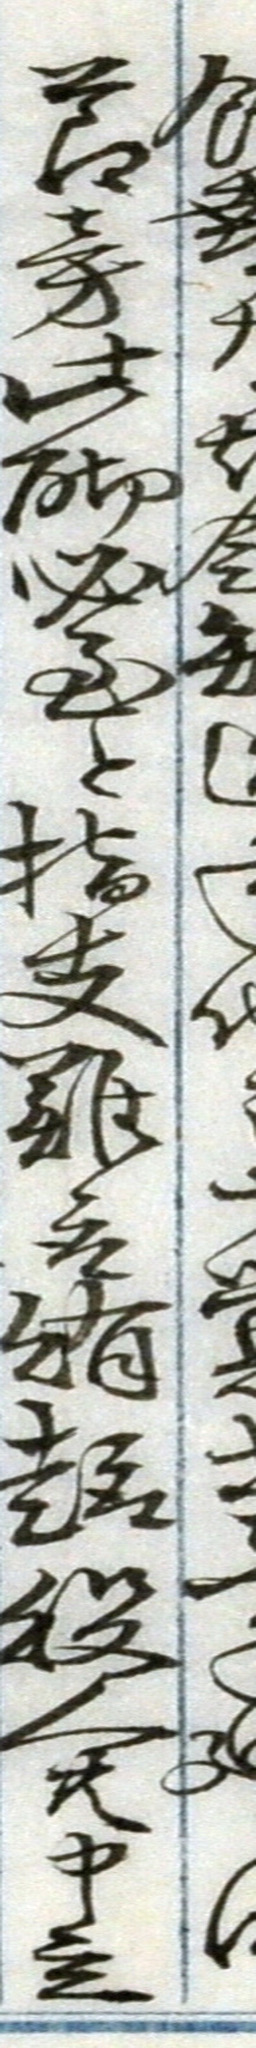節旁此砌必至と指支難取賄趣役人共申立
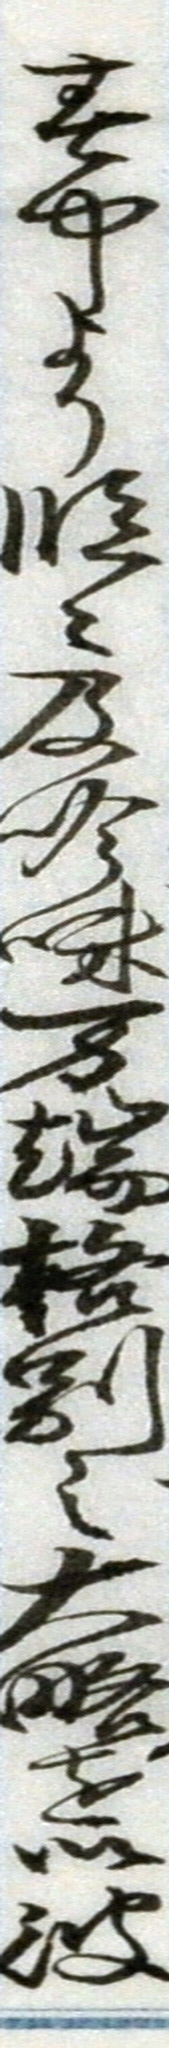春中より段々及吟味万端格別之大略を以彼
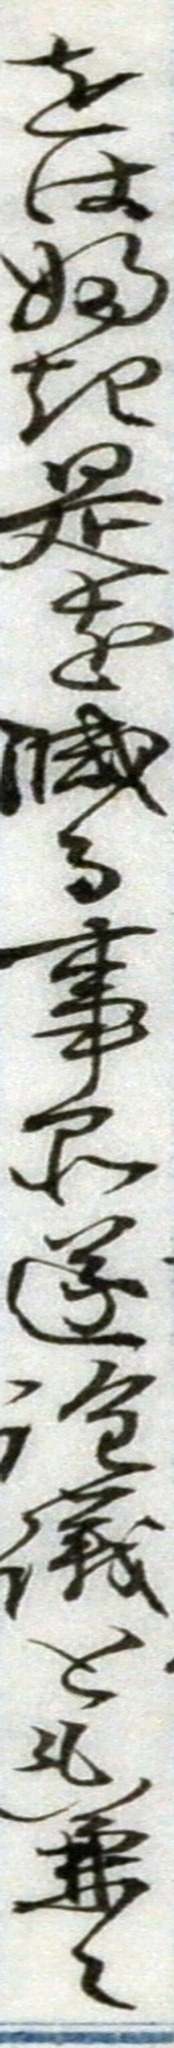をはふき是を減る事品遂詮議とも兼々
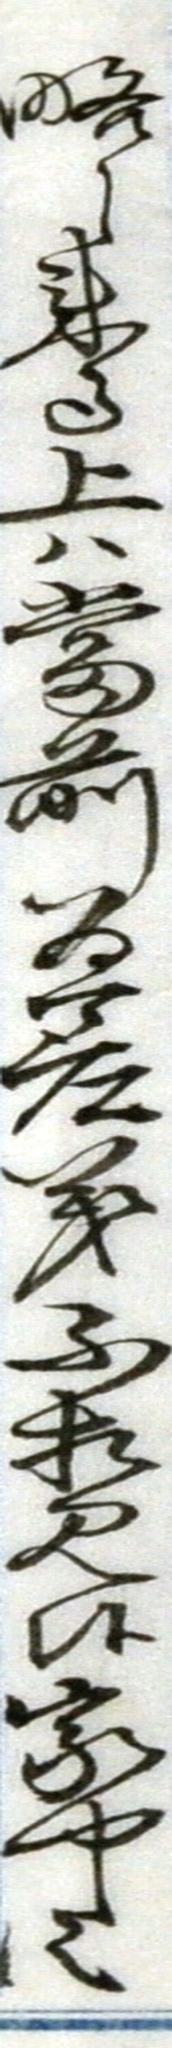略し来る上ハ当前為差義不相見候家中之
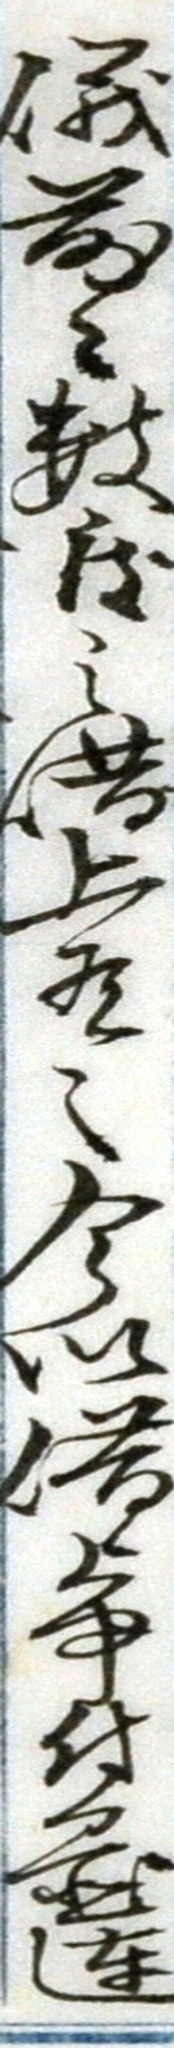儀前々数度之借上有之今以借上申付置連
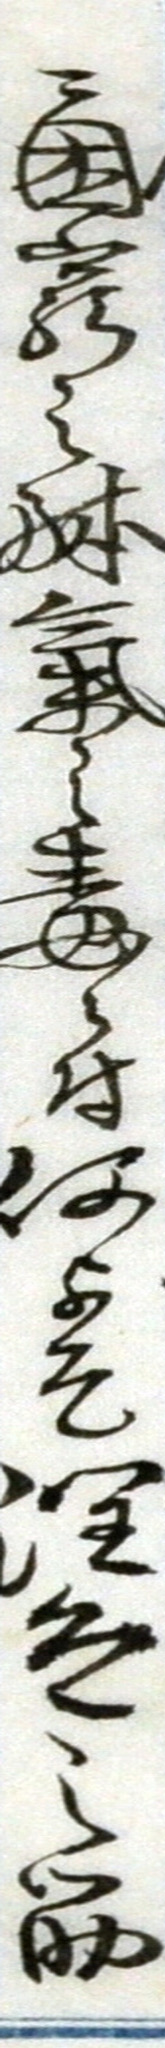ニ困窮之躰気之毒ニ付何とそ潤色之筋
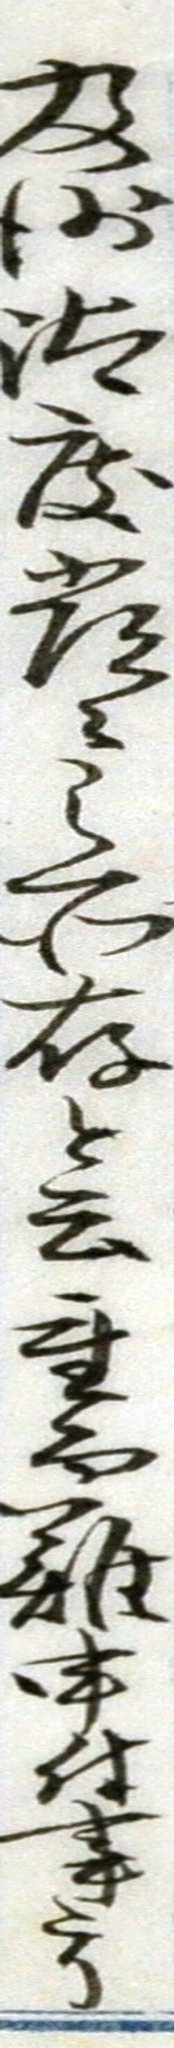及沙汰度常々之所存と云重而難申付事たり
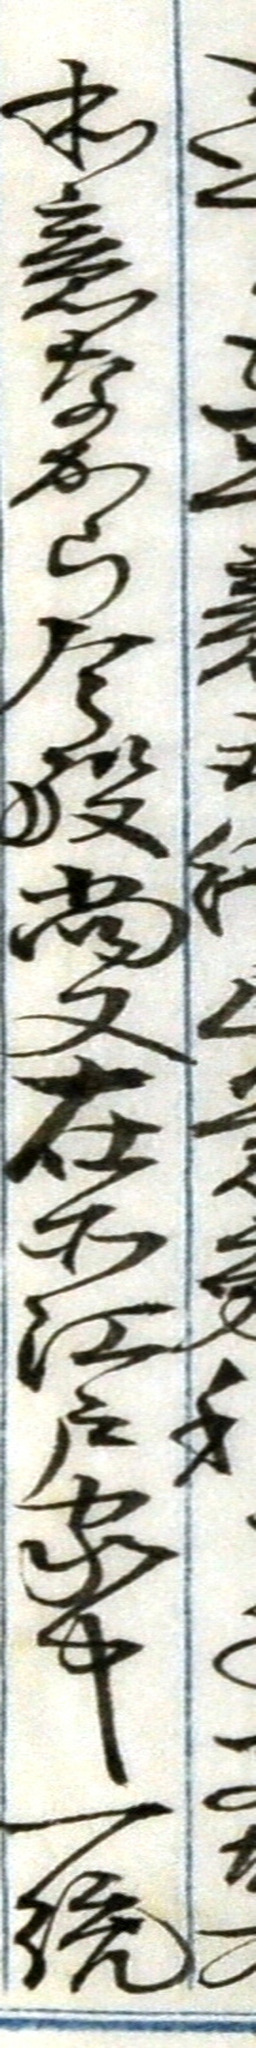如意なから今般尚又在所江戸家中一統
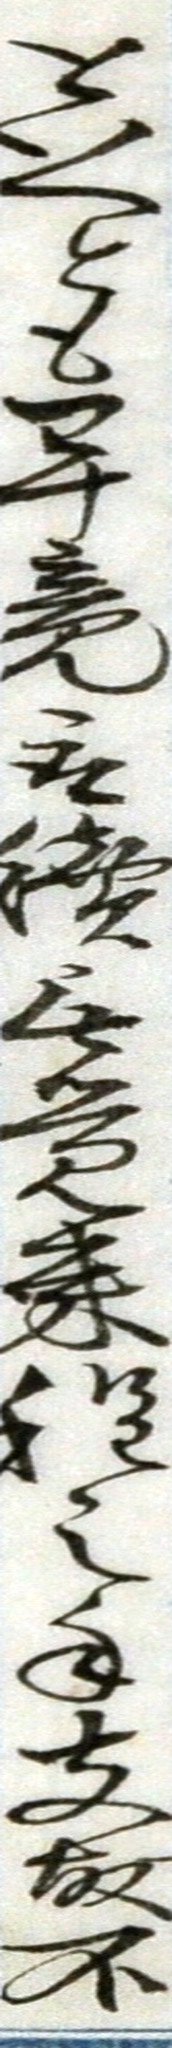といへとも畢竟取続無覚束程之手支故不

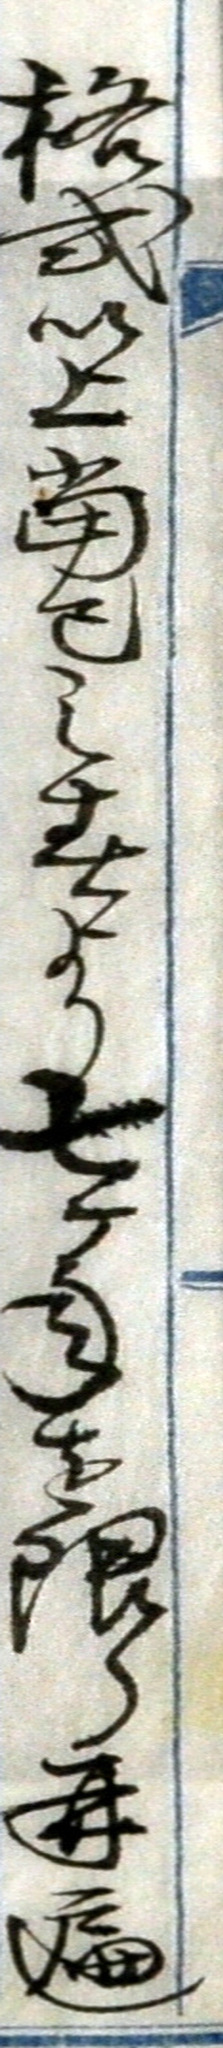格式以上当己之春より七ヶ年を限り并遍
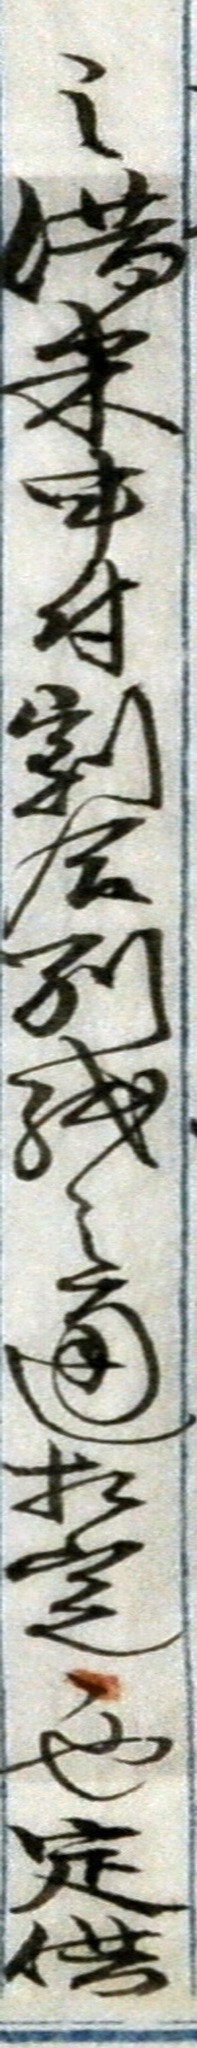之借米申付割合別紙之通相定也定借
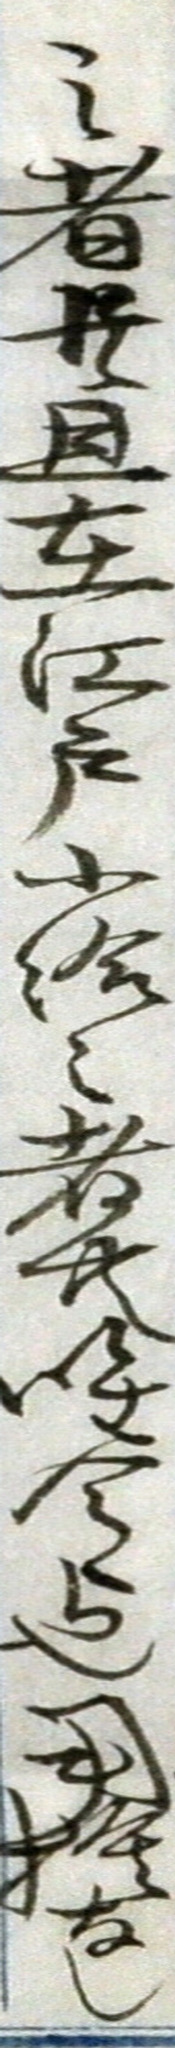之者共且在江戸小給之者共唯今迄用捨なし
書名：頼由公御定書
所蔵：伊那市立高遠町図書館・合同会社AMANE
